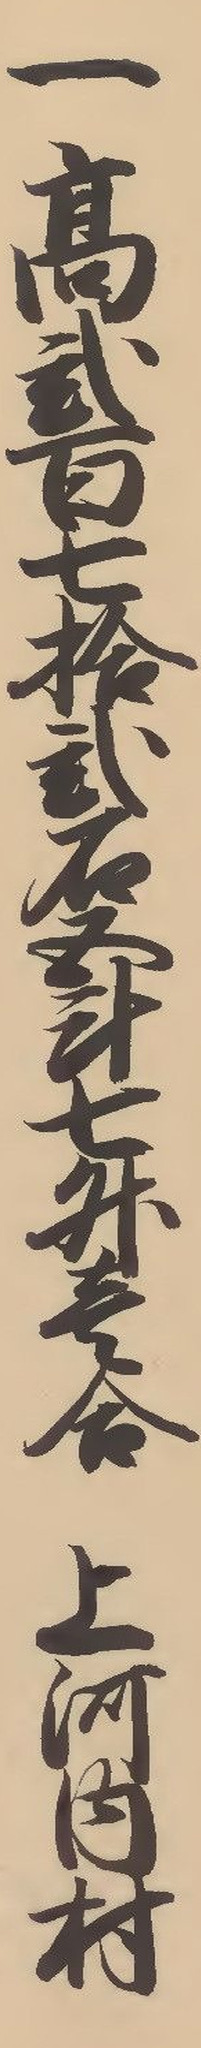一高弐百七拾弐石五斗七升壱合上河内村
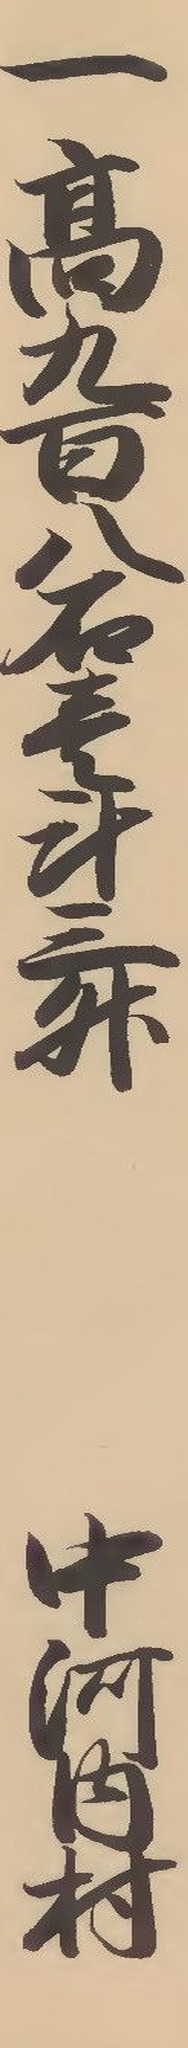一高九百八石壱斗三升中河内村
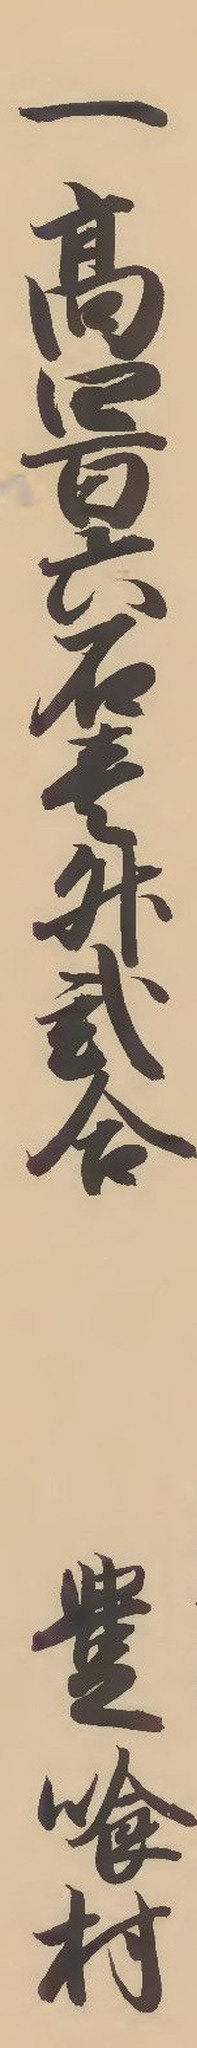一高四百六石壱升弐合豊喰村

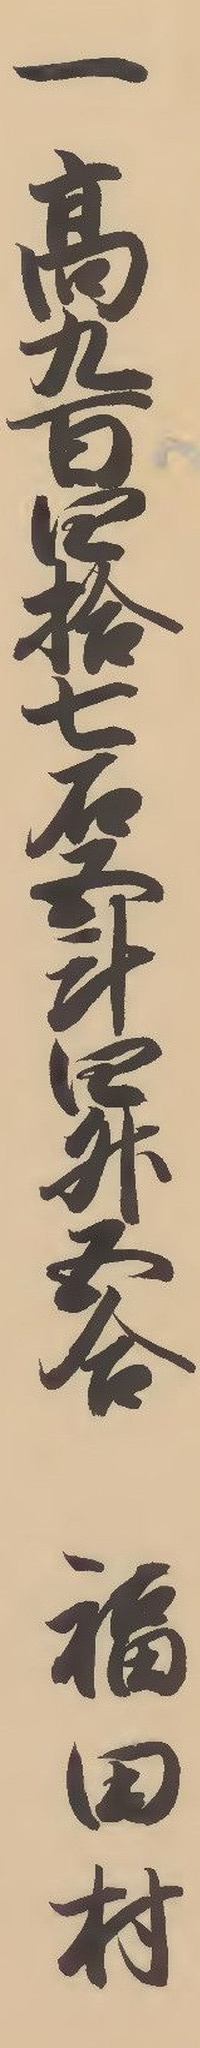一高九百四拾七石五斗四升五合福田村
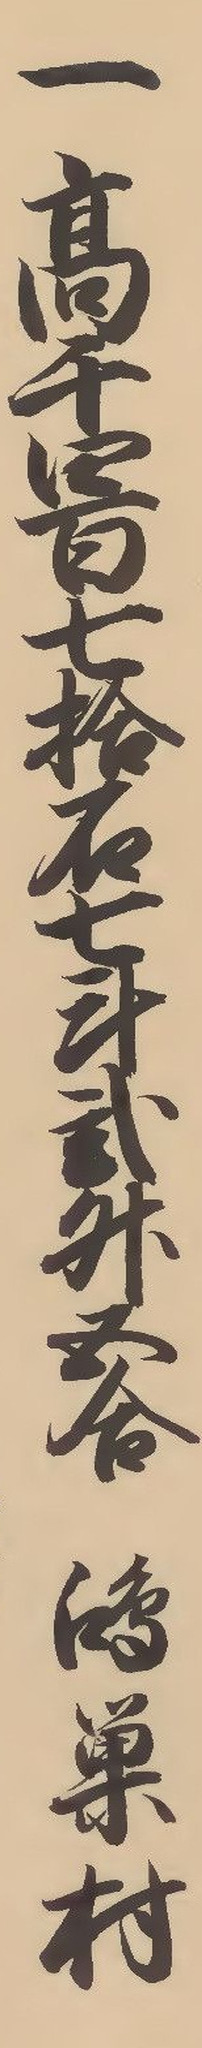一高千四百七拾石七斗弐升五合鴻巣村
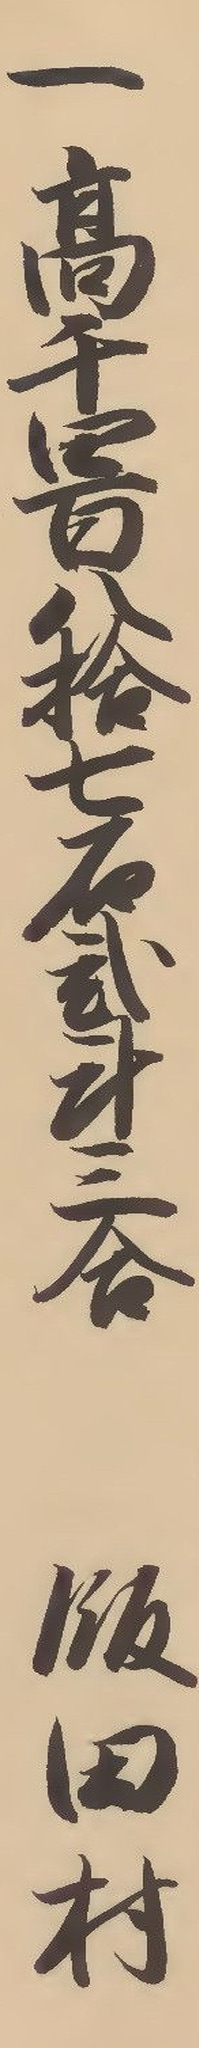一高千四百八拾七石弐斗三合飯田村
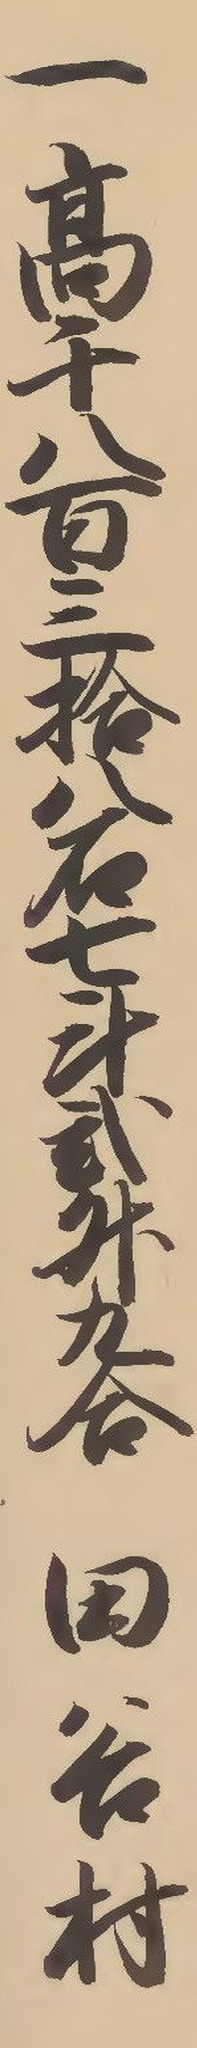一高千八百三拾八石七斗弐升九合田谷村
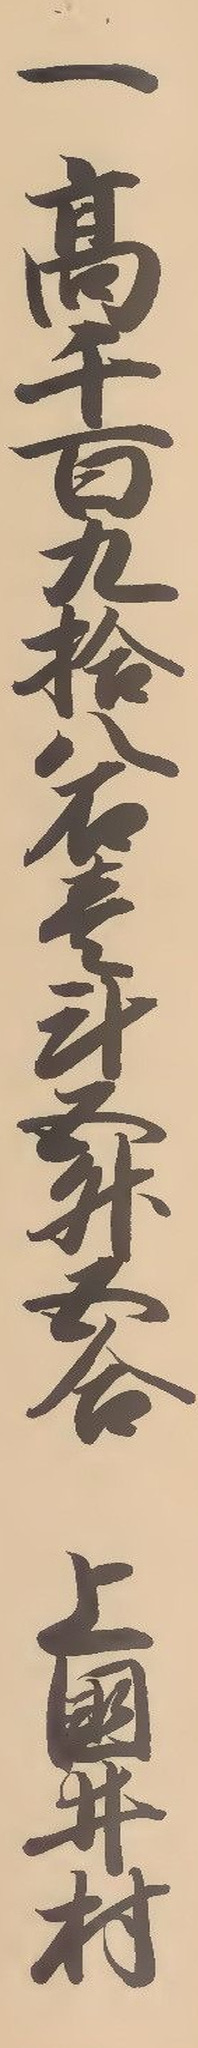一高千百九拾八石壱斗五升五合上国井村
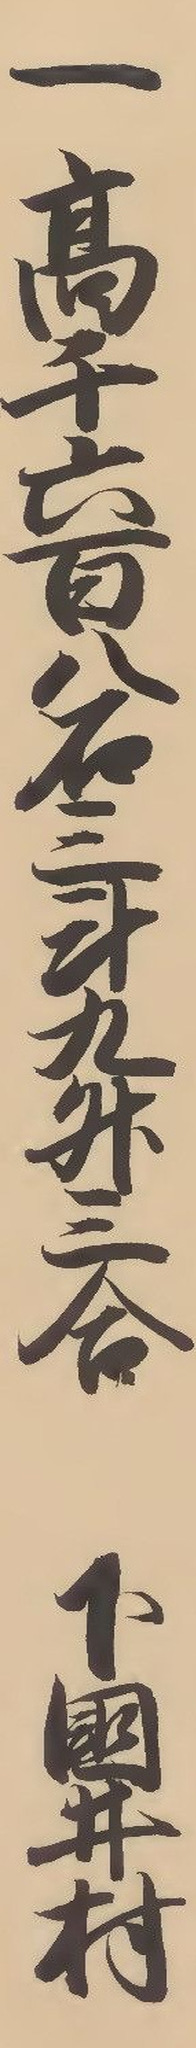一高千六百八石三斗九升三合下国井村
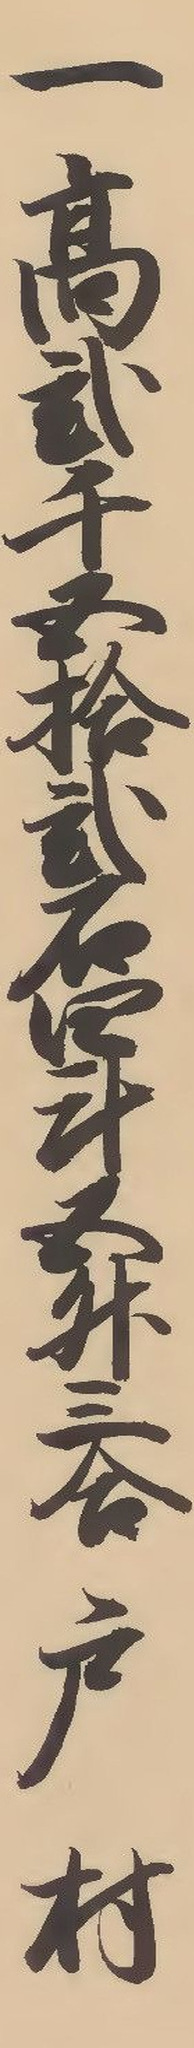一高弐千五拾弐石四斗五升三合戸村

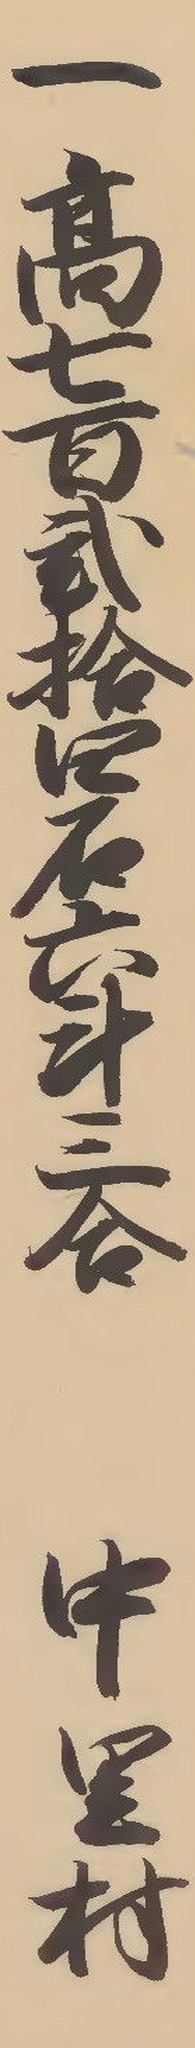一高七百弐拾四石六斗三合中里村
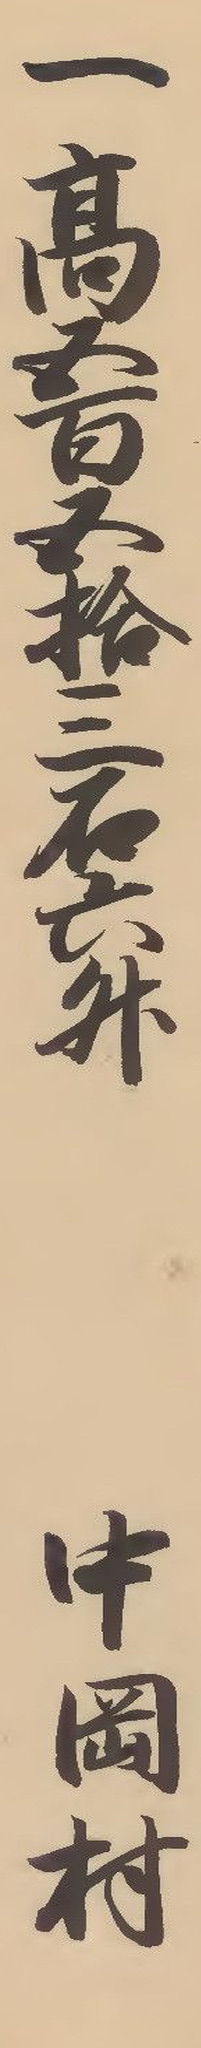一高五百五拾三石六升中岡村
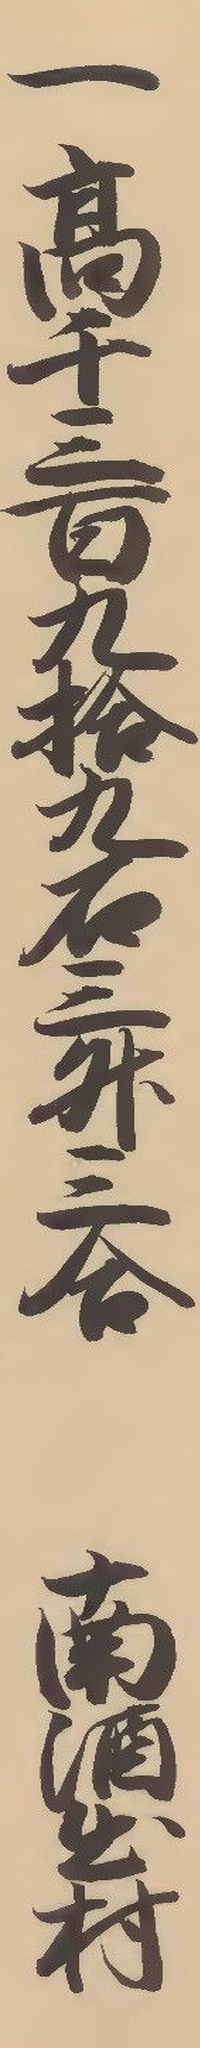一高千三百九拾九石三升三合南酒出村
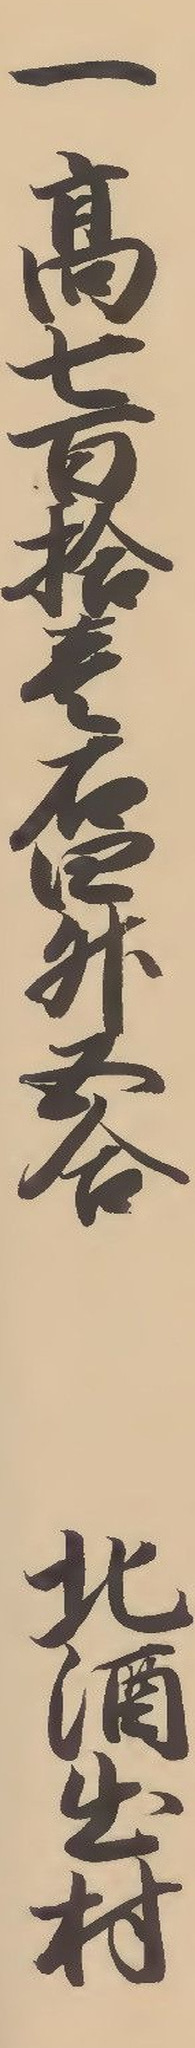一高七百拾壱石四升五合北酒出村
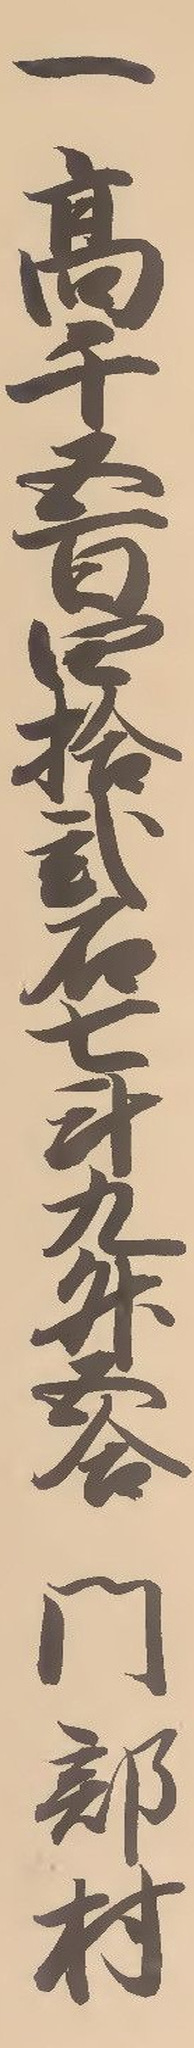一高千五百四拾弐石七斗九升五合門部村
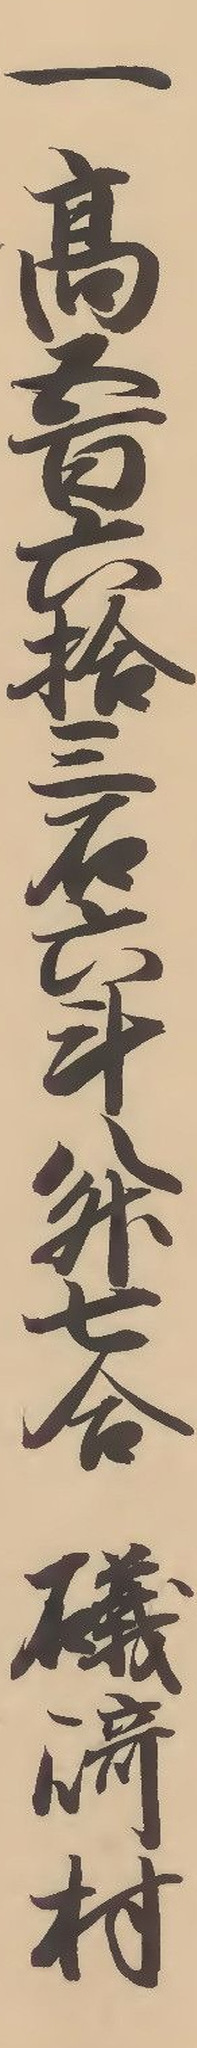一高五百六拾三石六斗八外七合磯崎村
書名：常陸国郷帳
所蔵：国立公文書館 National Archives of Japan
